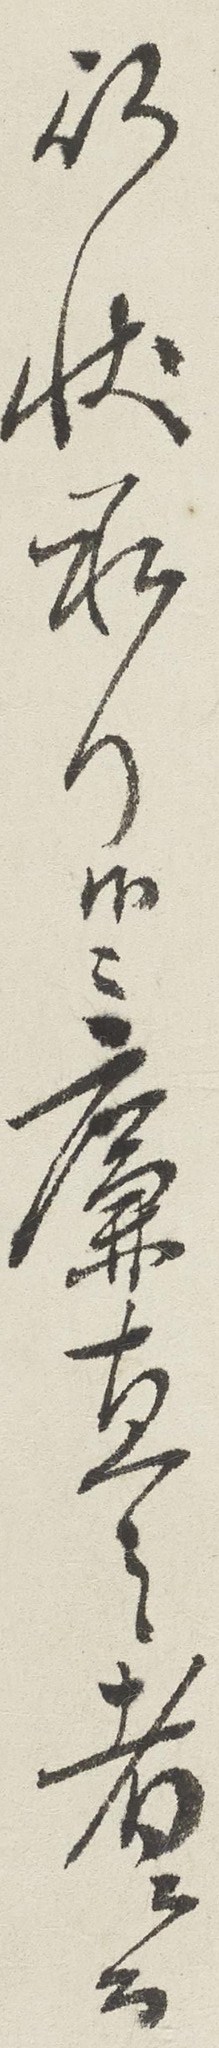行状承り候ニ廉直之者二而
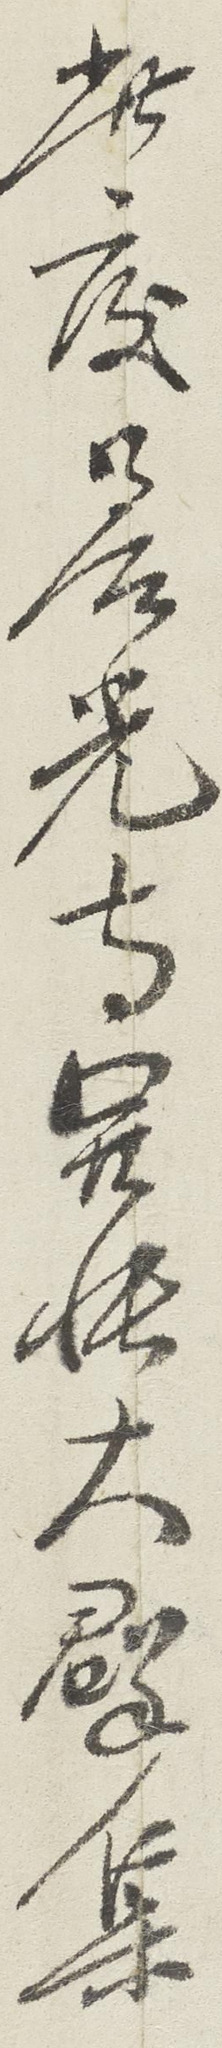此度善光寺開帳大群集
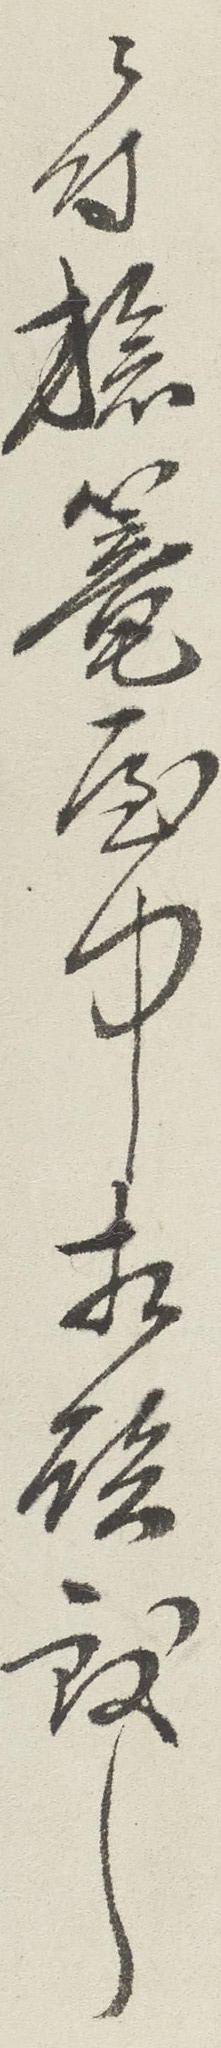ニ付旅籠屋中相談致し
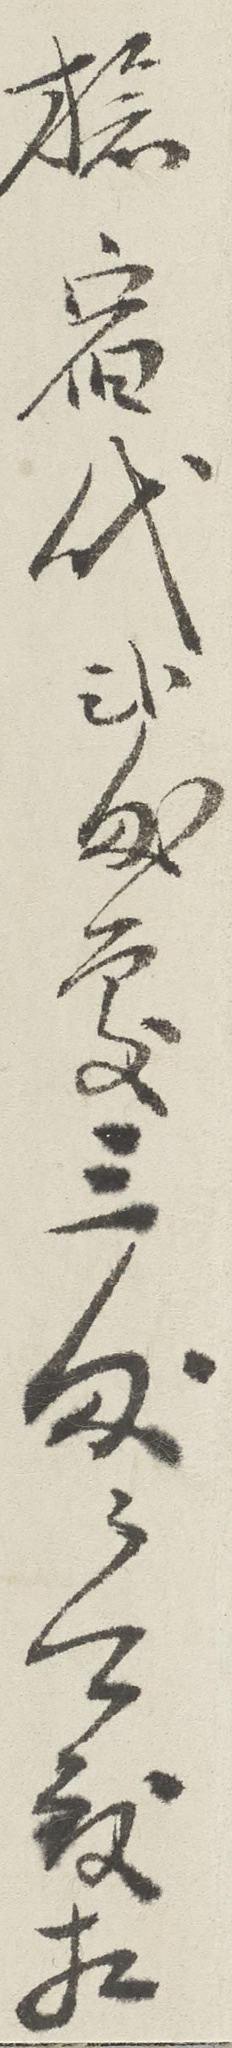旅宿代弐匁処三匁ニ可致相
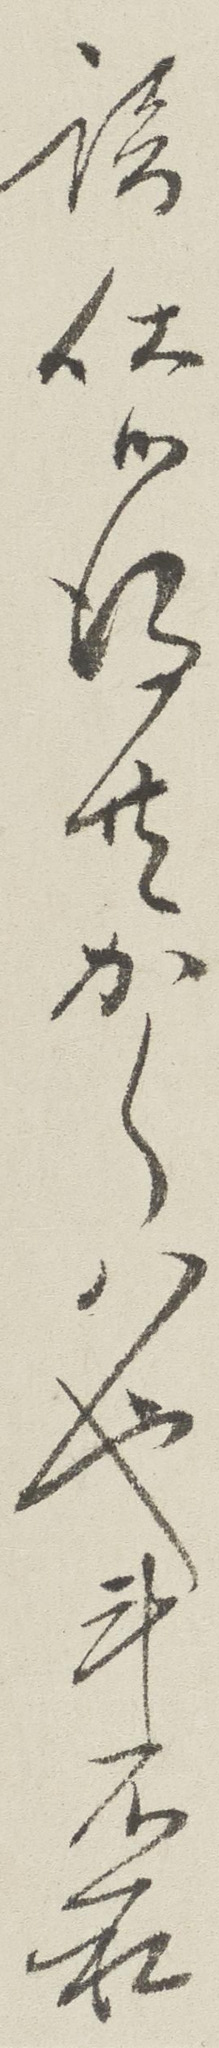談仕候得共かしはや計不承
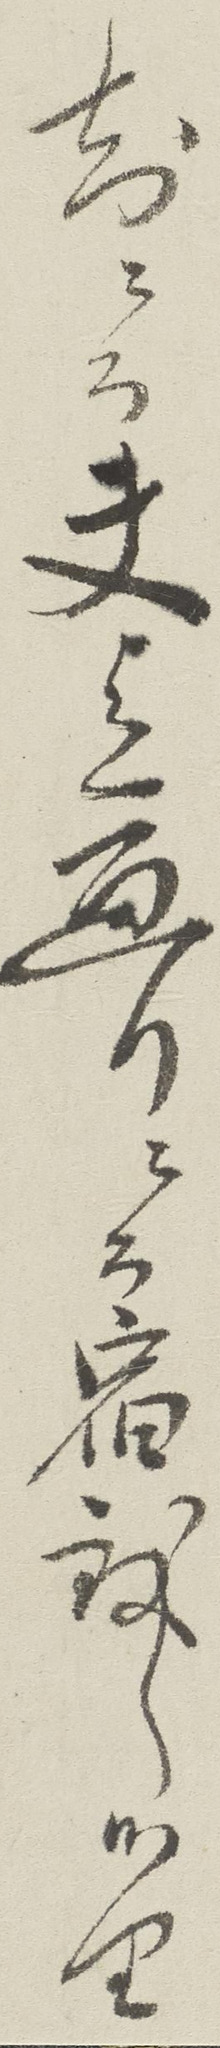知二而夫迄通り二而宿致し候由
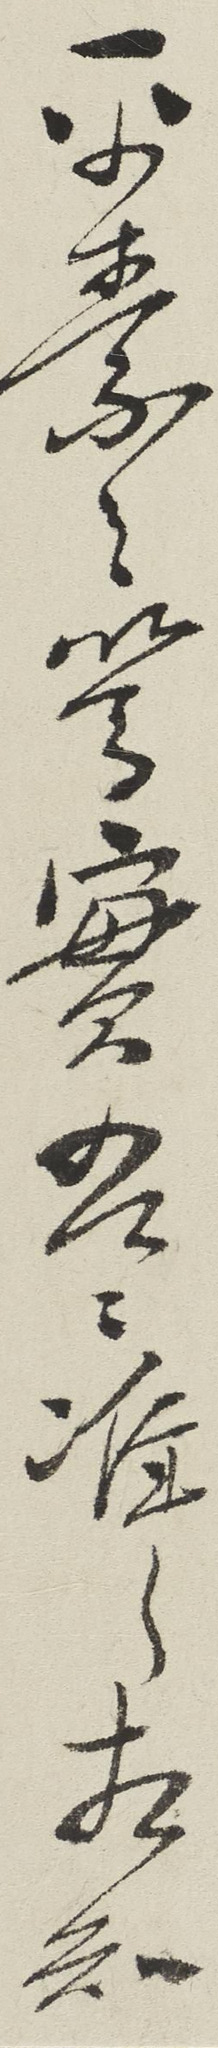平素之篤実右ニ准し相知
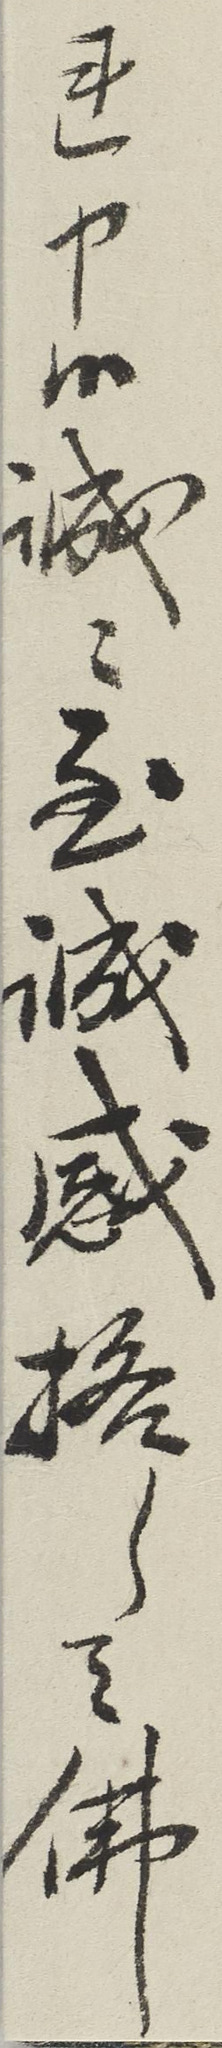れ申候誠ニ至誠感格して仏

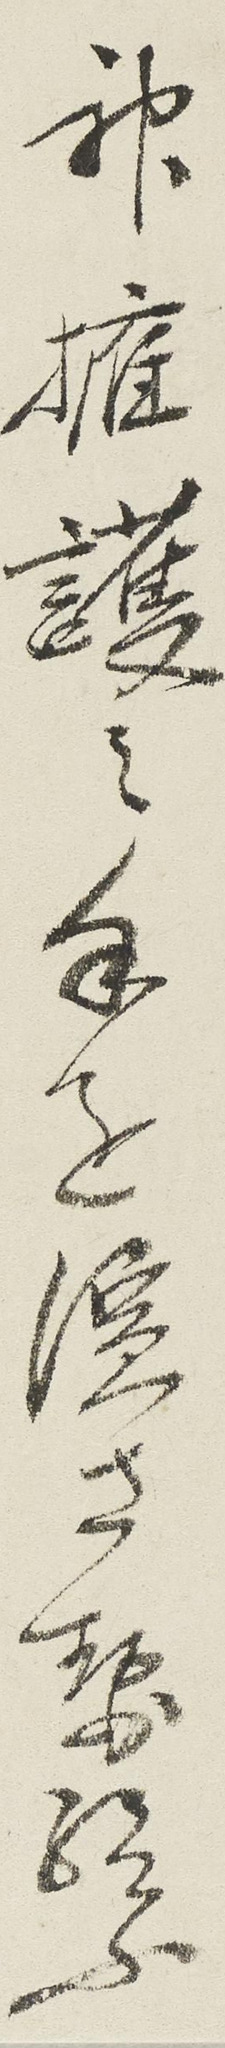神擁護之手を演させ給ふ
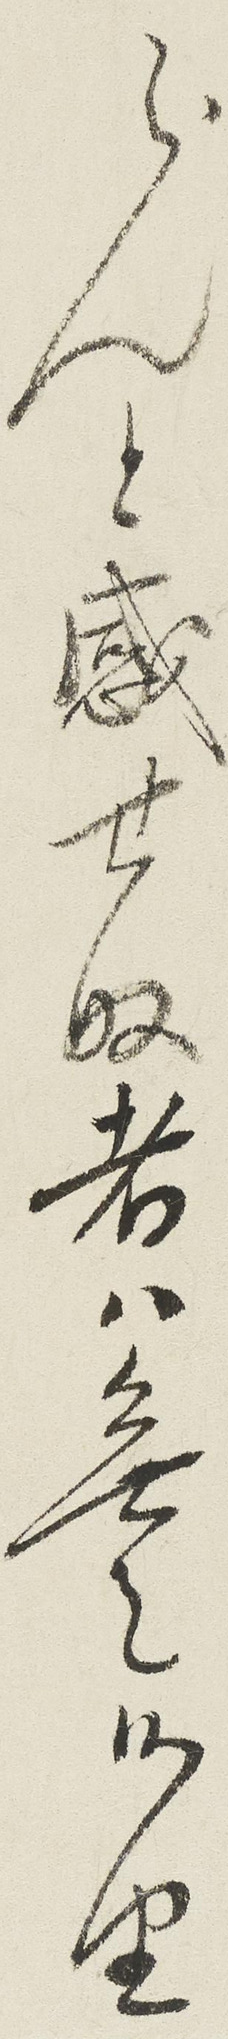らんと感せぬ者は無之候由
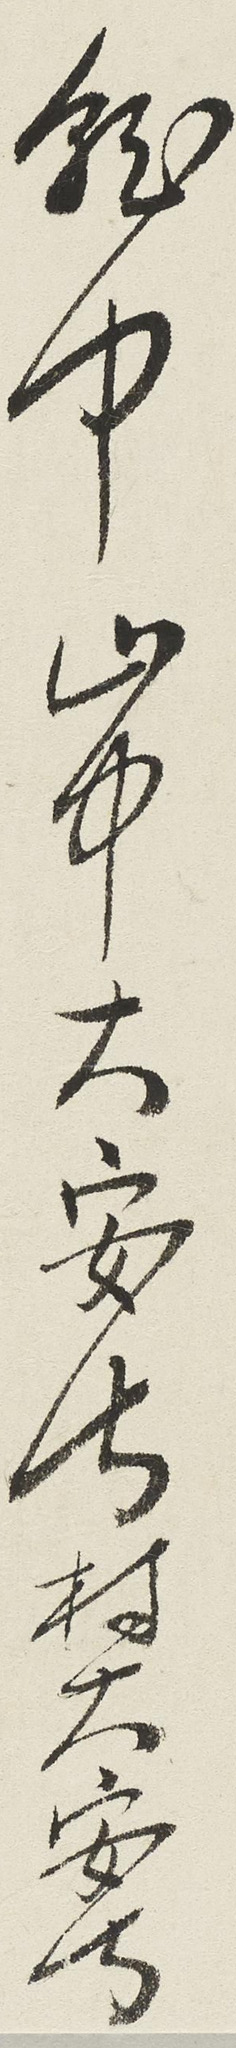就中山中大安寺村大安寺
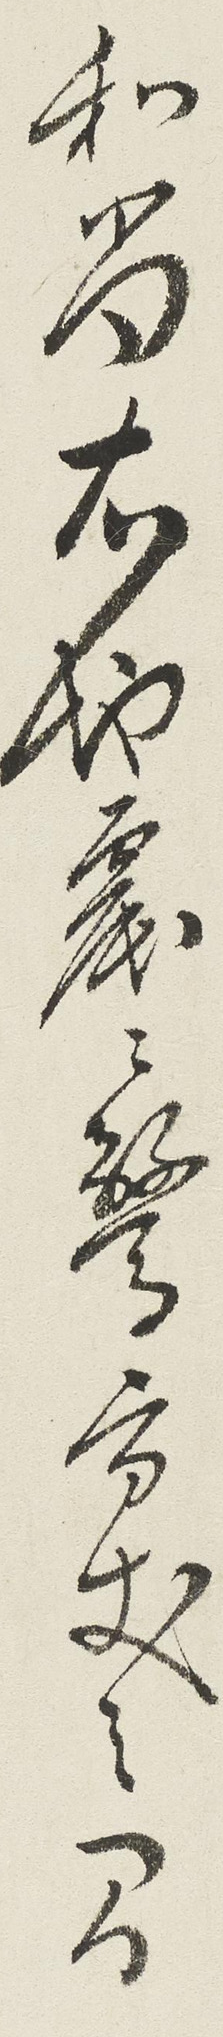和尚右地震ニ驚方丈之間
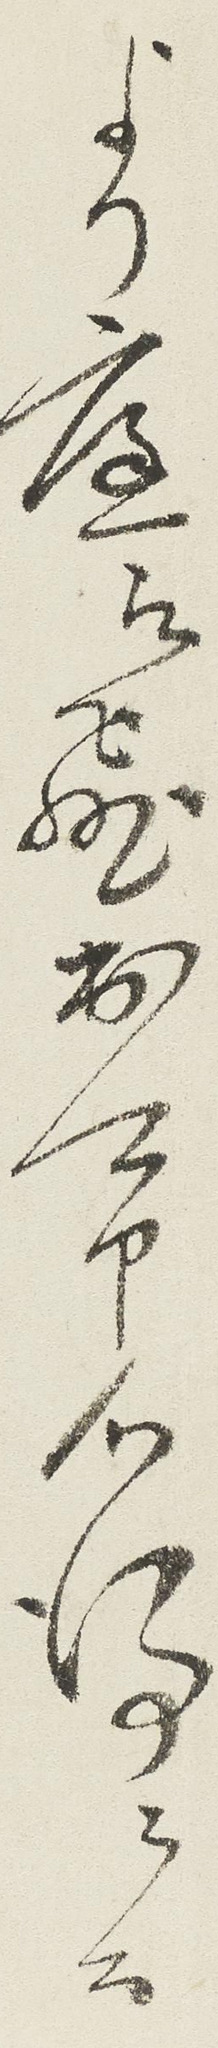より庭え飛出可申候心得二而
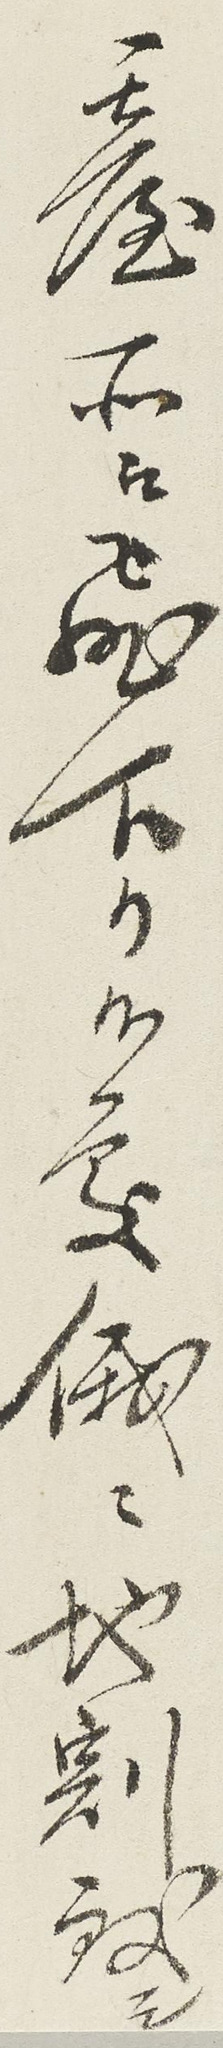台所え飛下り候処俄ニ地割致シ
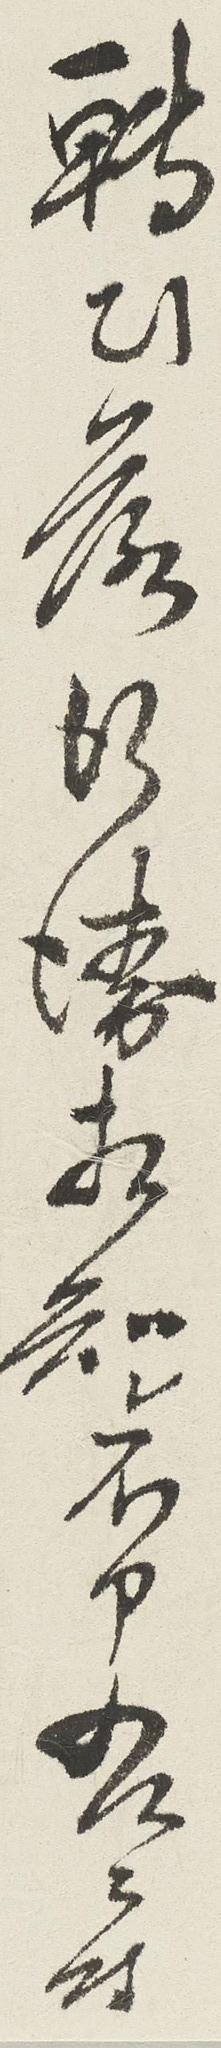転ひ落行衛相知レ不申右ニ付
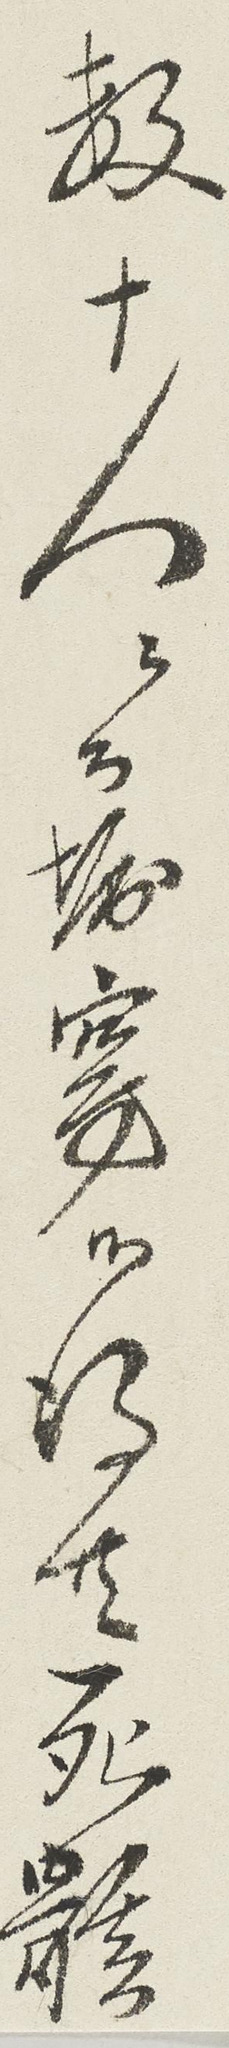数十人二而堀穿候得共死骸
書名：[善光寺地震に関する書状]
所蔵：東京大学地震研究所図書室 Earthquake Research Institute Library, The University of Tokyo, JAPAN
